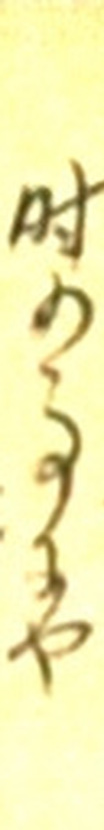時の事にや
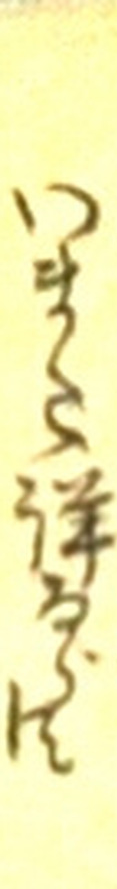いまた詳ならす
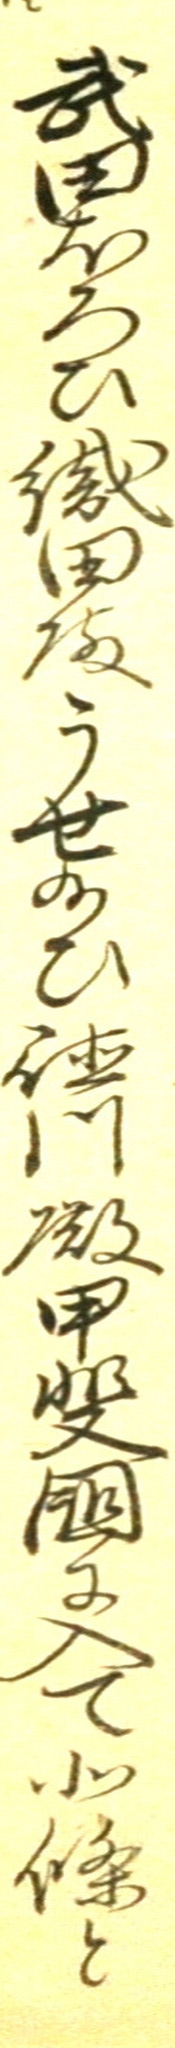武田ほろひ織田殿うせ給ひ徳川殿甲斐国に入て北条と
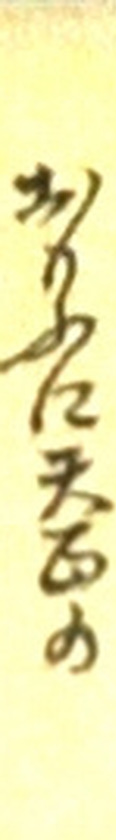おもふに天正の
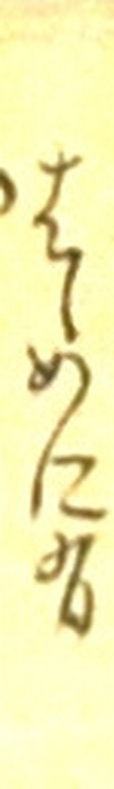はしめに有
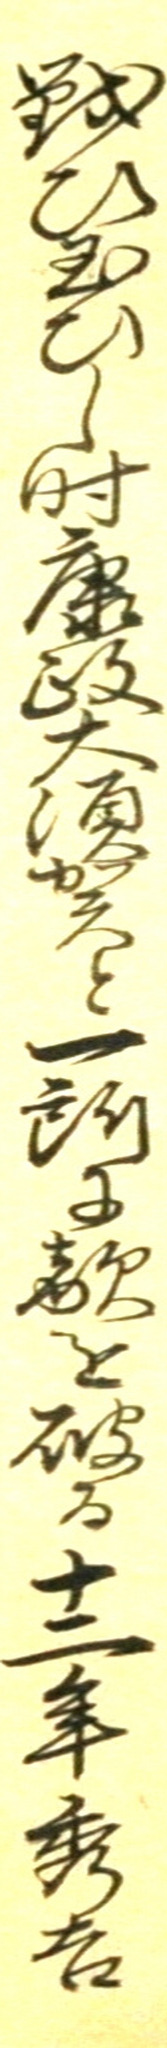戦ひ玉ひし時康政大須賀と一所に敵を破る十二年秀吉
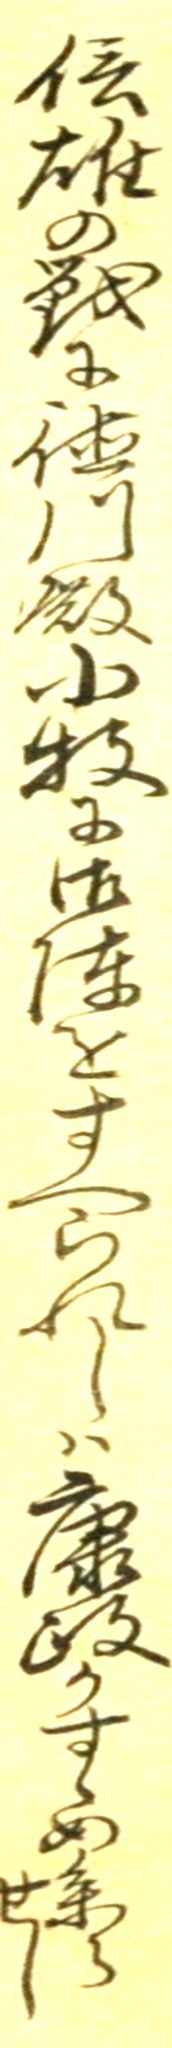信雄の戦に徳川殿小牧に御陣をすへられしは康政かすゝめ参らせし

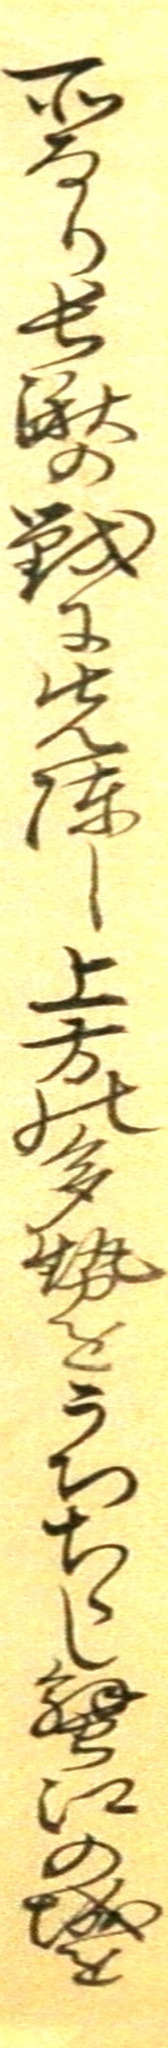所なり長湫の戦に先陣し上方の多勢をうちちらし蟹江の城を
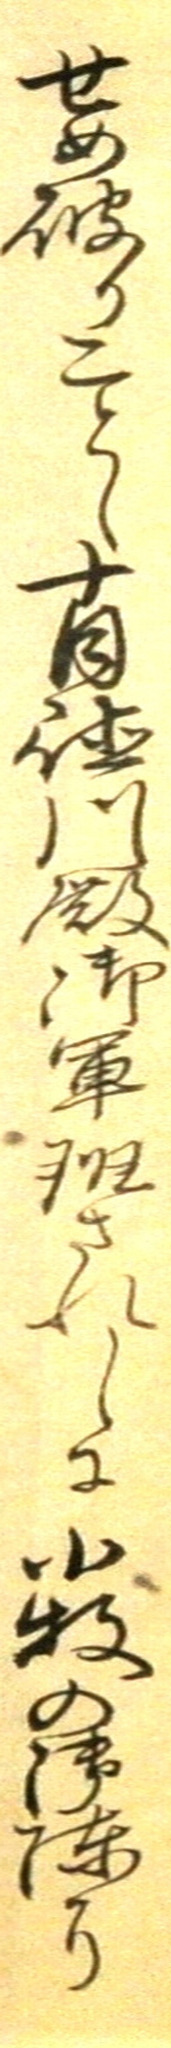せめ破りことし十月徳川殿御軍班されしに小牧の御陣に
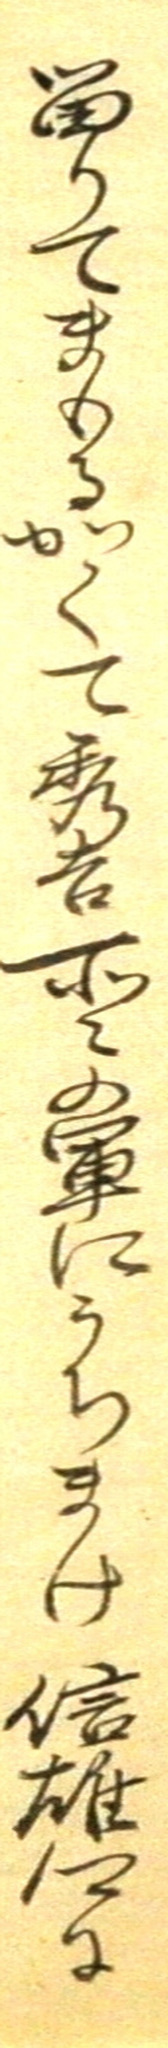留りてまもるかくて秀吉所々の軍にうちまけ信雄卿に
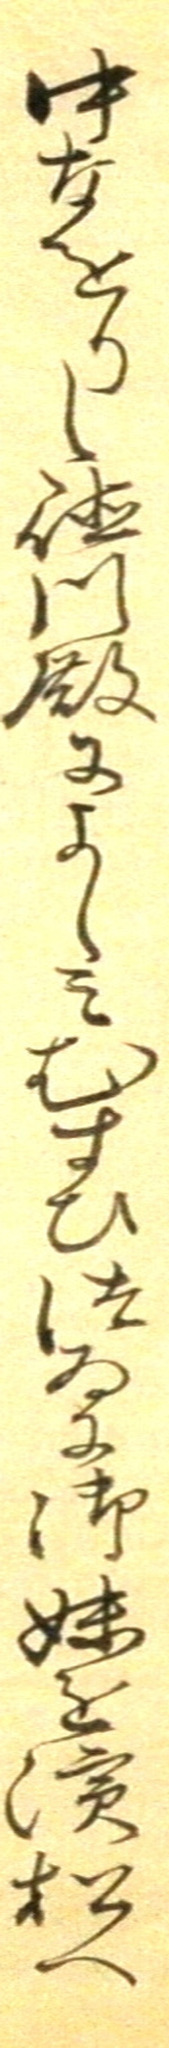中なをりし徳川殿によしみむすひつゐに御妹を浜松へ
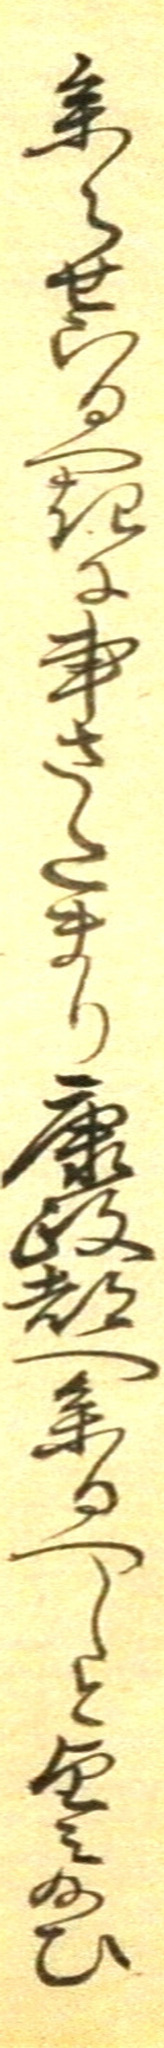参らせらるへきに事さたまり康政都へ参るへしと望み給ひ
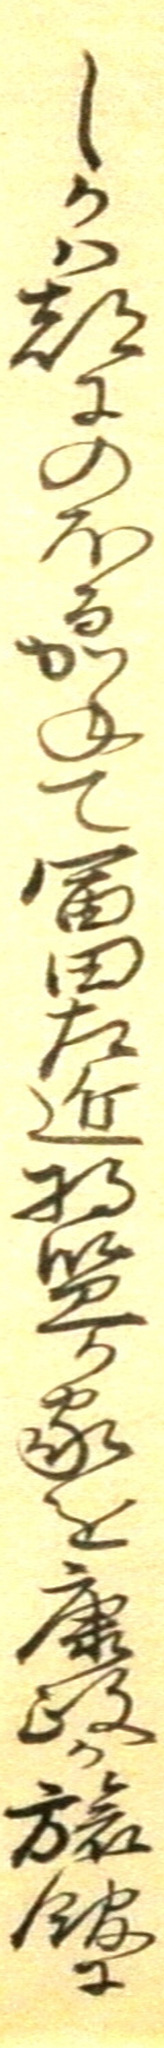しかは都にのほるかねて富田左近将監か家を康政か旅館に
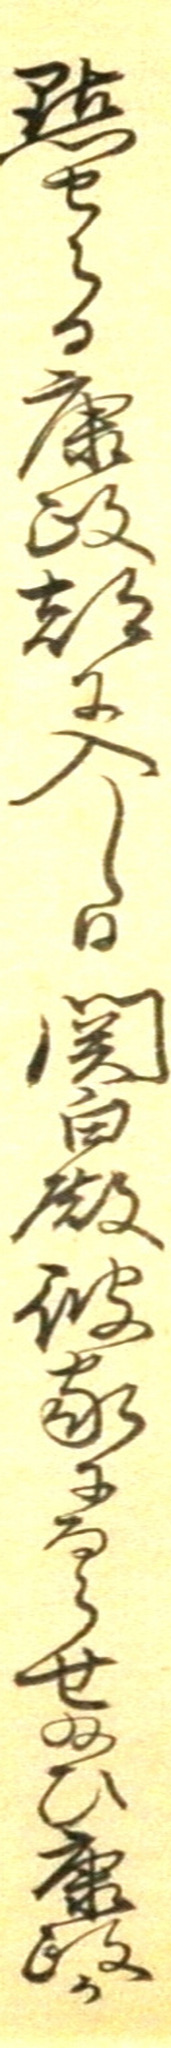点せらる康政都に入し日関白殿彼家にならせ給ひ康政か
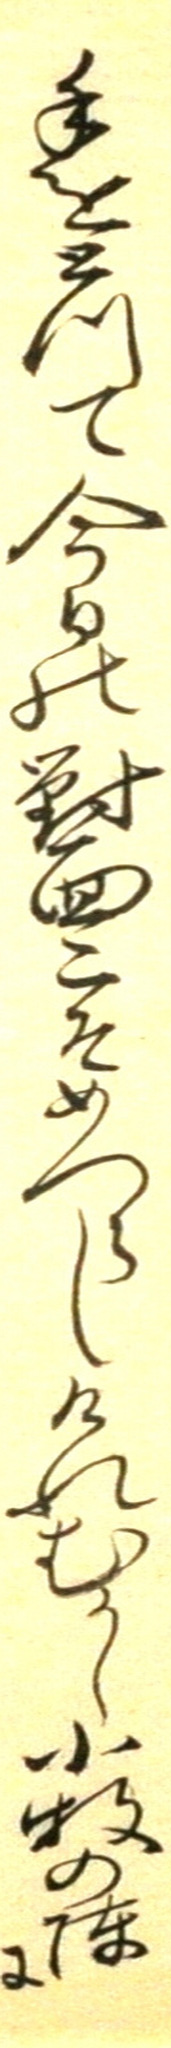手をとつて今日の対面こそめつらしけれむかし小牧の陣に
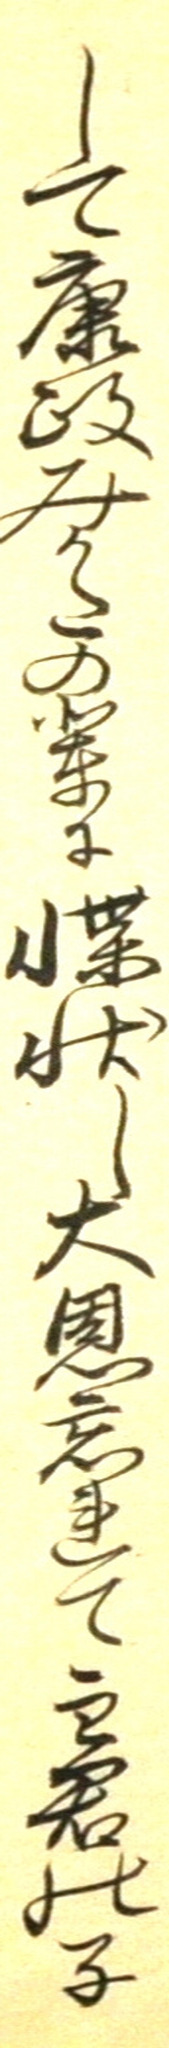して康政みかたの輩に牒状し大恩わす忘れて主君の子
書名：藩翰譜（四・上）
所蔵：伊那市立高遠町図書館・合同会社AMANE
